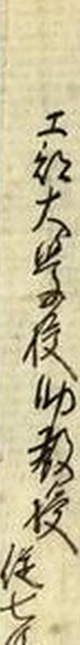工部大学校助教授
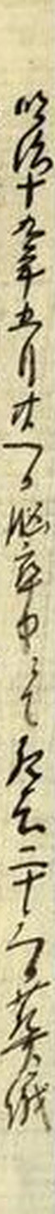明治十九年五月廿一日脳卒中ニて死去二十三日葬儀
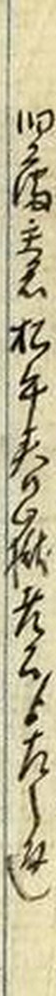旧藩主君松平春嶽君公ゟ左之通
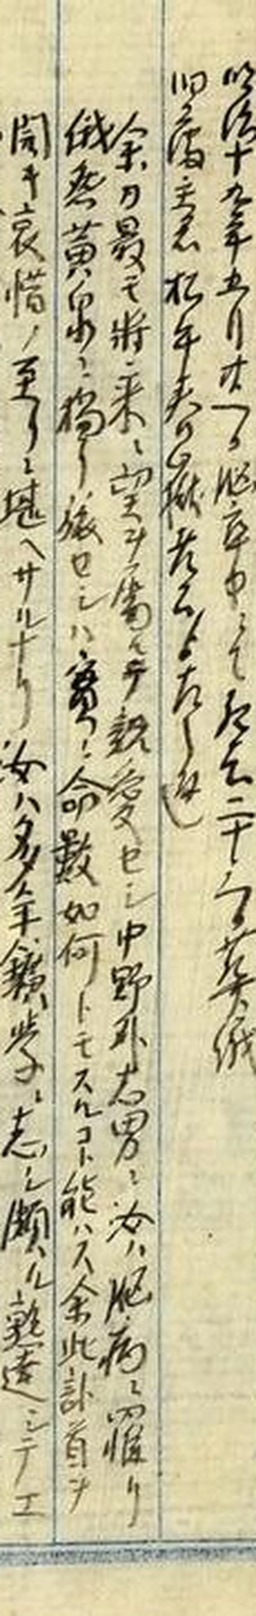余カ最モ将来ニ望ヲ属シテ親愛セシ中野外志男ニ汝ハ脳病ニ罹リ
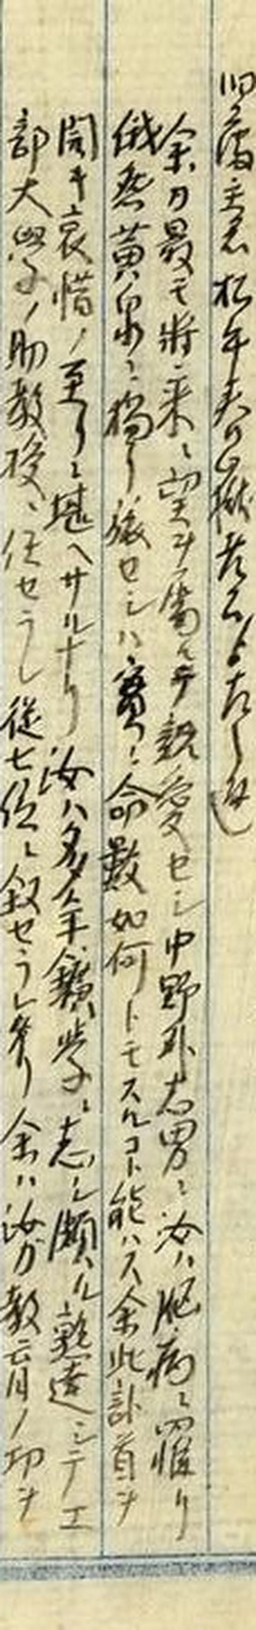俄然黄泉ニ独リ旅セシハ実ニ命数如何トモスルコト能ハス余此訃首ヲ
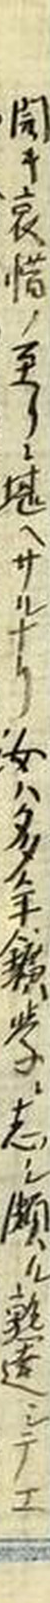聞キ哀惜ノ至リニ堪へサルナリ汝ハ多年鉱学ニ志シ頗ル熟達シテ工
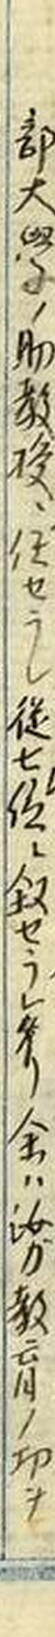部大学ノ助教授ニ任セラレ従七位ニ叙セラレタリ余ハ汝ガ教育ノ功ヲ
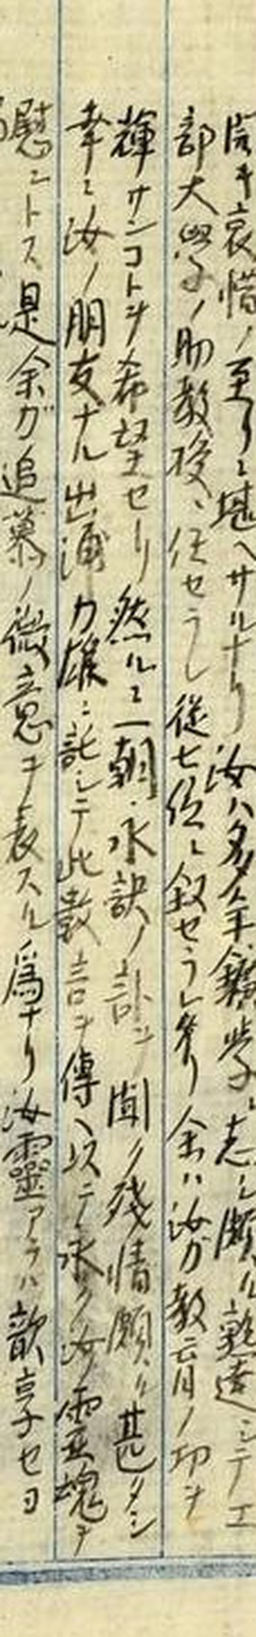輝サンコトヲ希望セリ然ルニ一朝永訣ノ訃ヲ聞ク残情顧ル甚タシ
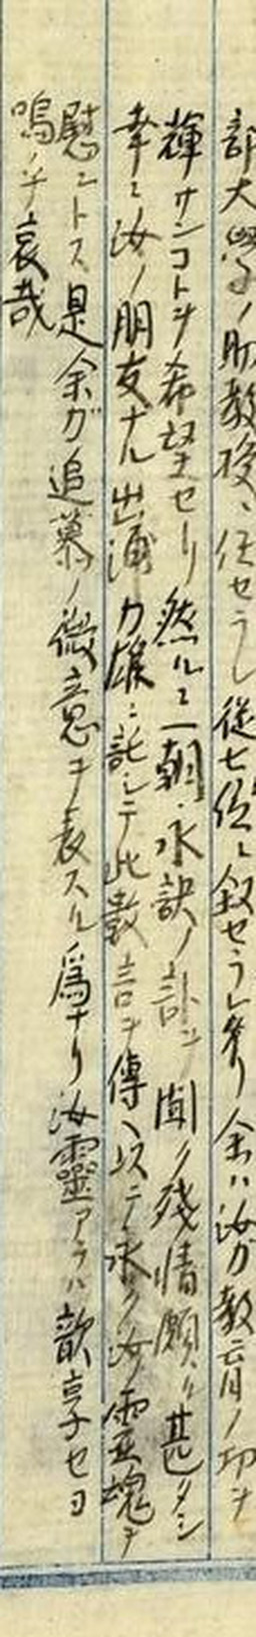幸ニ汝ノ朋友ナル出浦力雄ニ託シテ此数言ヲ伝へ以テ永ク汝ノ霊魂ヲ
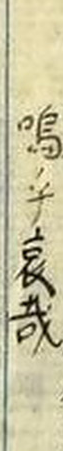嗚乎哀哉
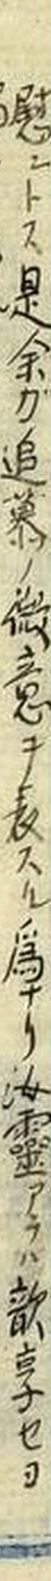慰ントス是余ガ追慕ノ微意ヲ表スル為ナリ汝霊アラハ歆享セヨ
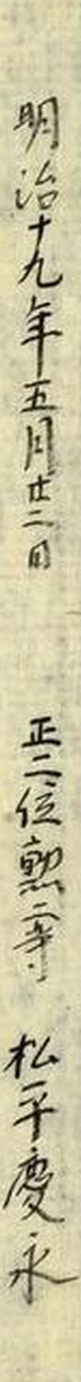明治十九年五月廿二日正二位勲二等松平慶永
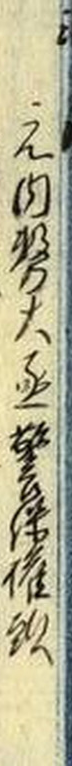元内務大丞警保権頭
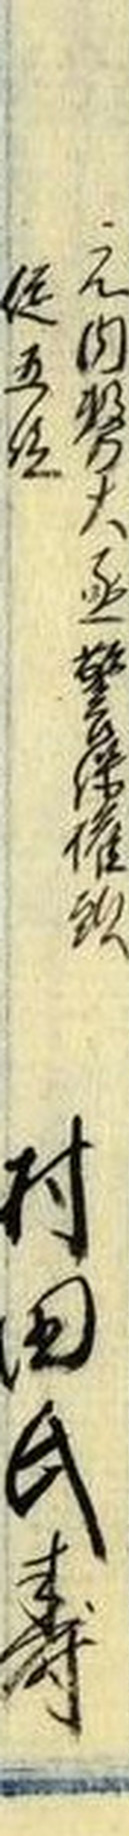元内務大丞警保権頭
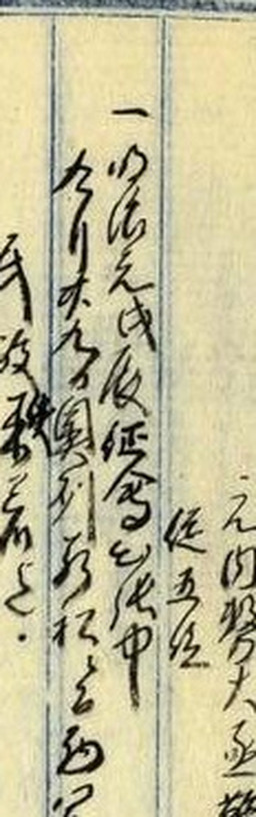一明治元戊辰征会出張中
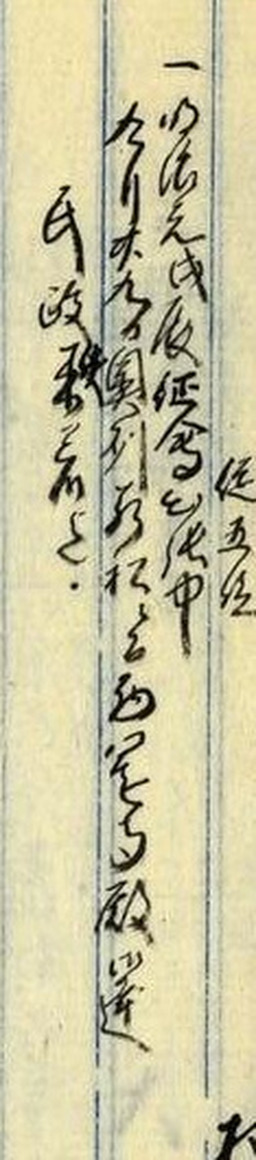九月廿九日奥州若松ニ西園寺殿御達
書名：温古集 三巻
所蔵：福井県文書館 Fukui Prefectural Archives
